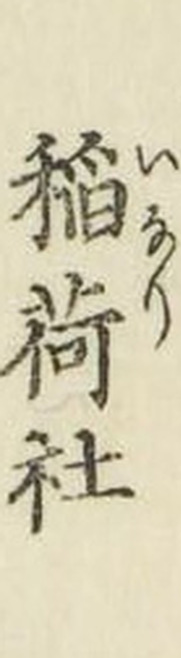稲荷社
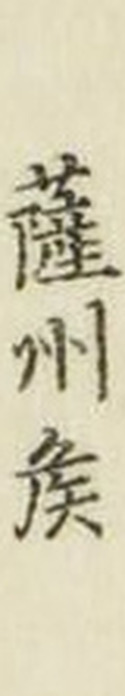薩州侯
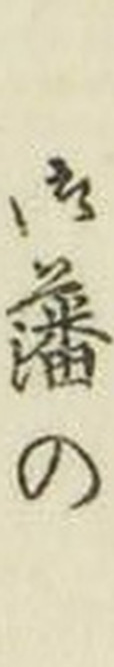御藩の
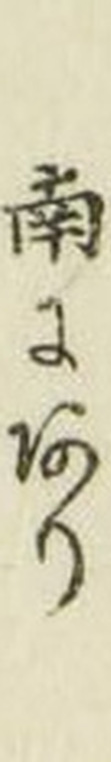南にあり

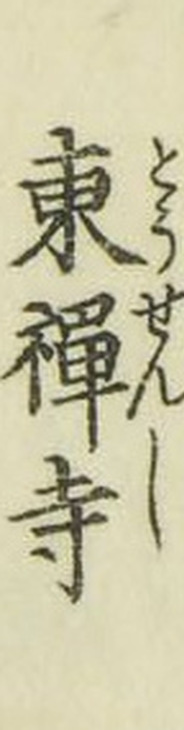東禅寺

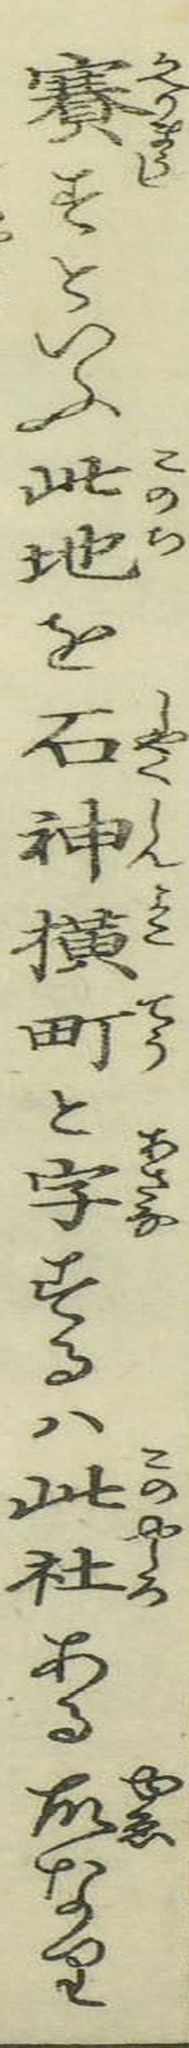賽すといふ此地を石神横町と字するは此社ある故なり
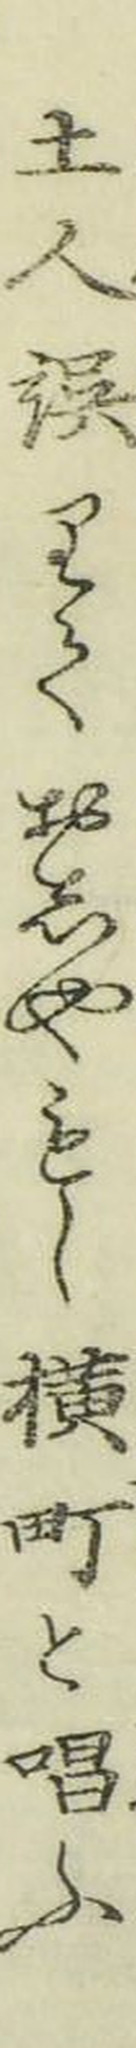土人誤りておしやもし横町と唱ふ
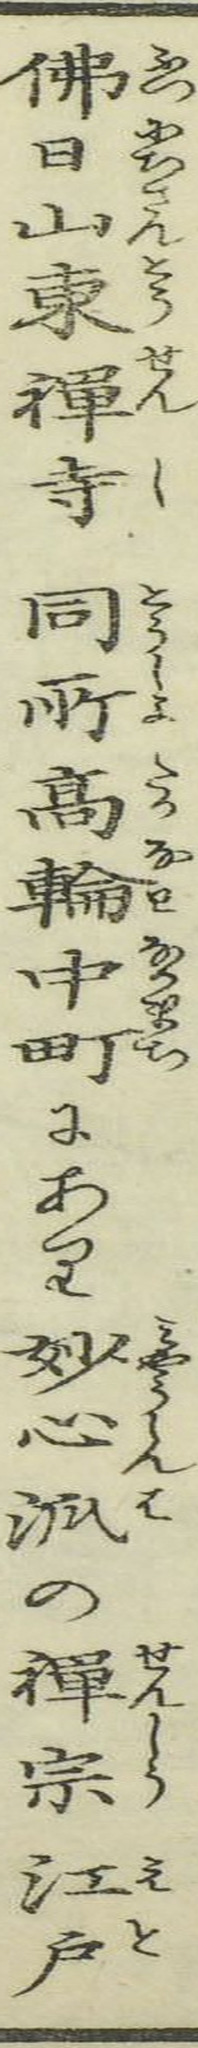佛日山東禅寺同所高輪中町にあり妙心派の禅宗江戸
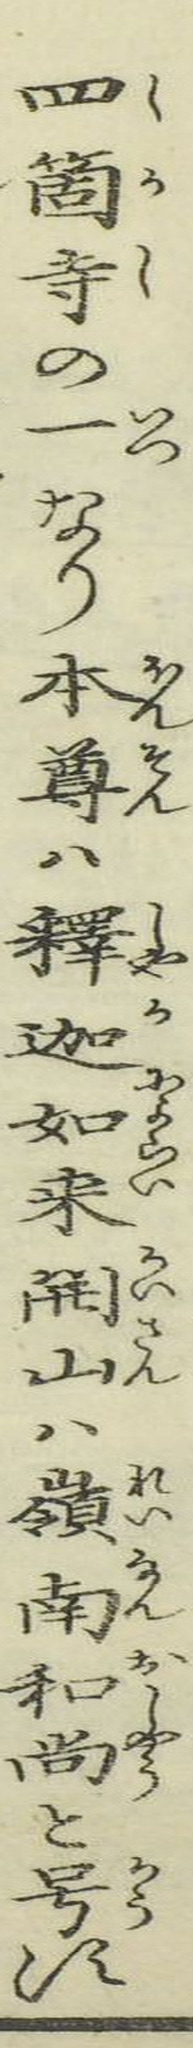四箇寺の一なり本尊は釋迦如来開山は嶺南和尚と号す
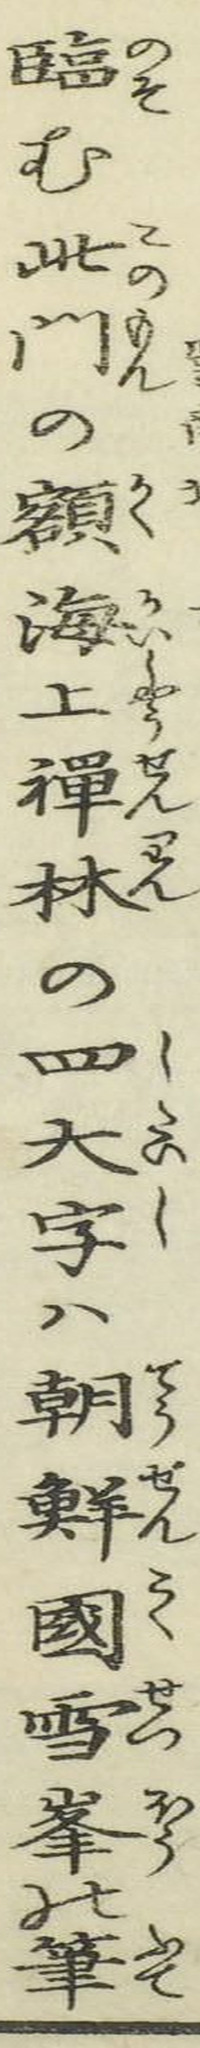臨む此門の額海上禅林の四大字は朝鮮國雪峯の筆
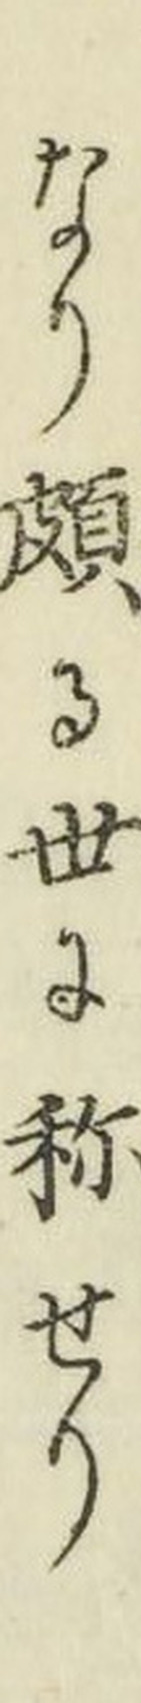なり頗る世に称せり
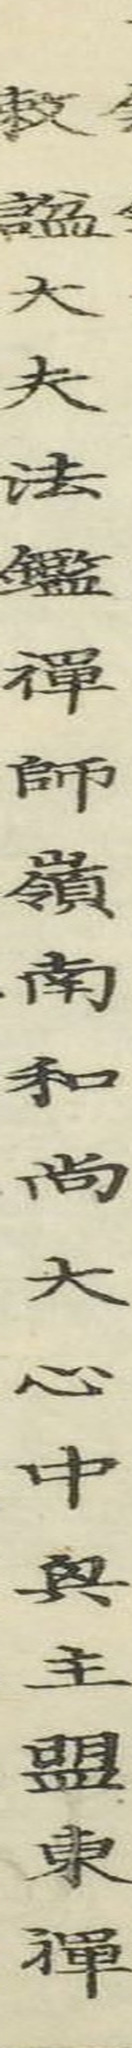敕諡大夫法鑑禅師嶺南和尚大心中興主盟東禅
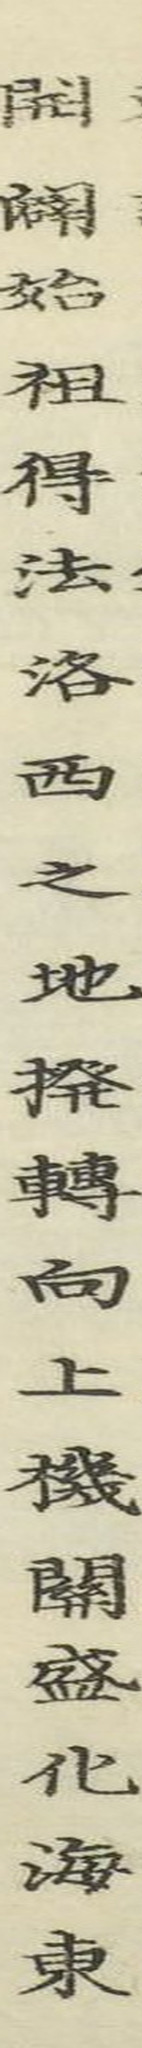開闢始祖得法洛西之地撥轉向上機関盛化海東
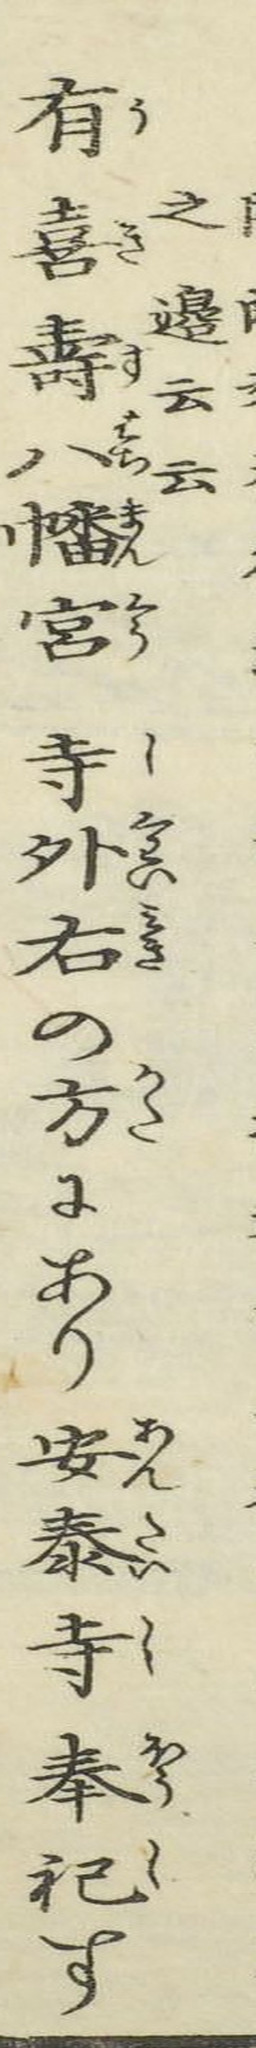有喜壽八幡宮寺外右の方にあり安泰寺奉祀す
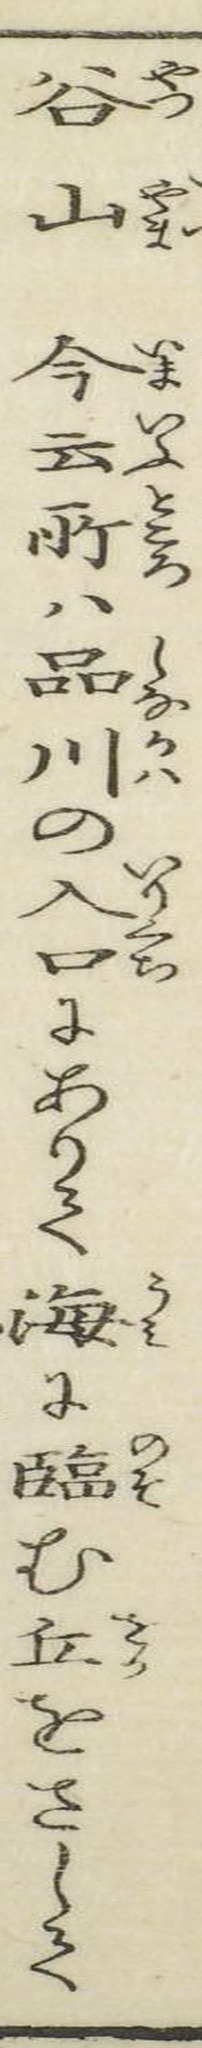谷山今云所は品川の入口にありて海に臨む丘をさして
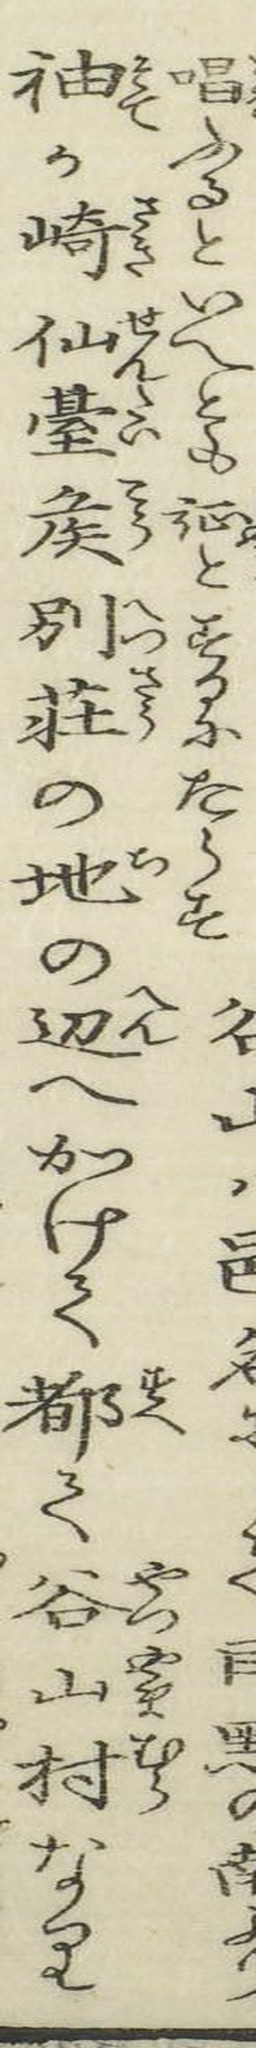袖ゕ崎仙臺侯別荘の地の辺へかけて都て谷山村なり
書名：江戸名所図会 20巻 巻之3
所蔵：東京学芸大学教育コンテンツアーカイブ
